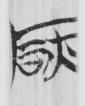庶
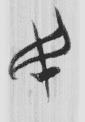民
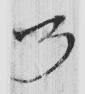乃
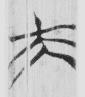夫
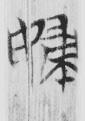婦
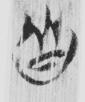皆
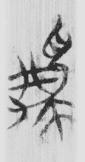{井爪力}
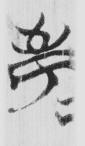{至于}=
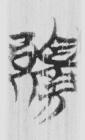{臱阝}
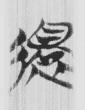{彳睘}
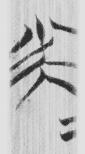少大=
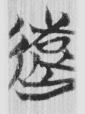遠
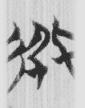{彳尼}
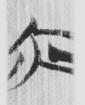亦
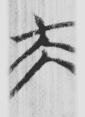夫
